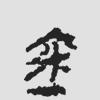金
